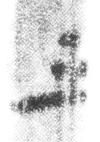三
